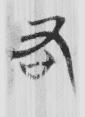右
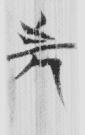先
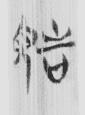{見告}
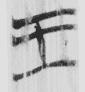王
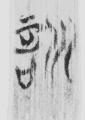訓
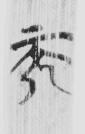而
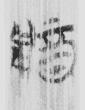𨟻
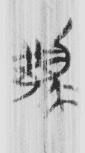{井力}
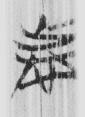者
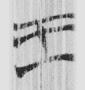王
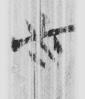必
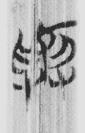與
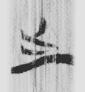之
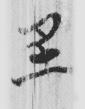{㔾土}
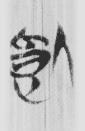飤
